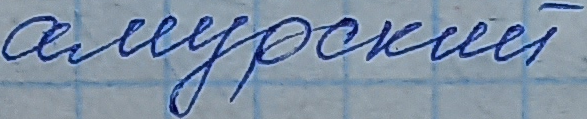амурский
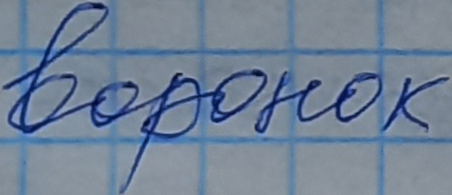воронок
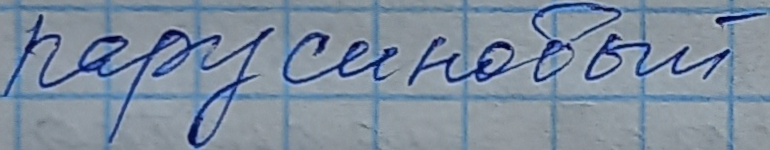парусиновый
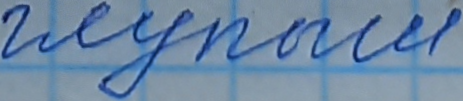глупыш
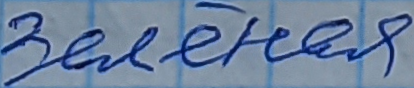зелёная
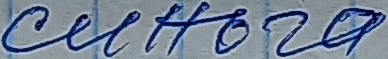синьга
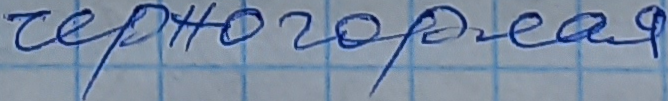черногорлая
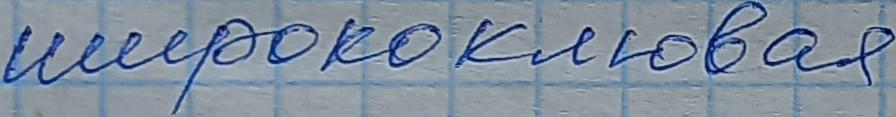ширококлювая
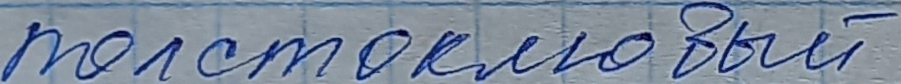толстоклювый
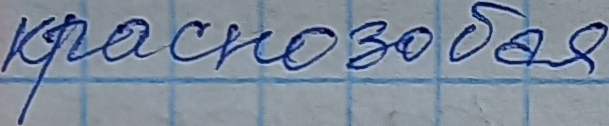краснозобая
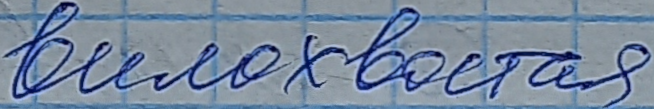вилохвостая
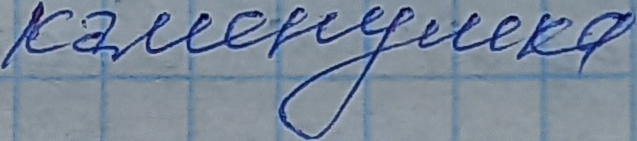каменушка
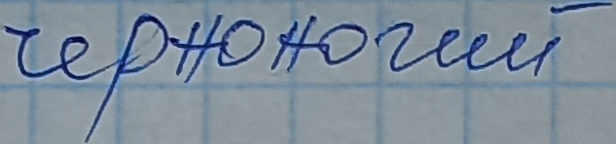черноногий
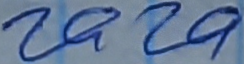гага
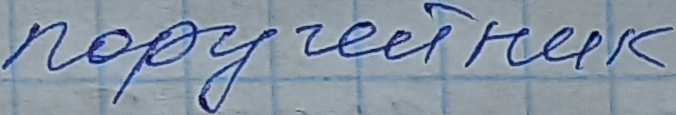поручейник
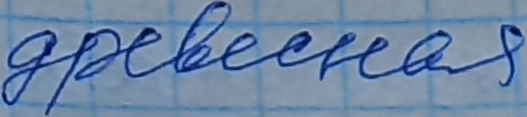древесная
